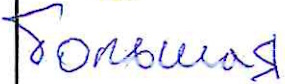большая
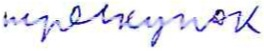трескунок
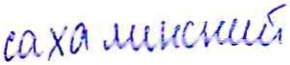саха линский
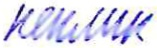кеклик
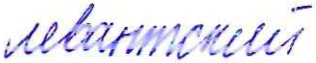левантский
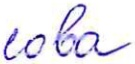сова
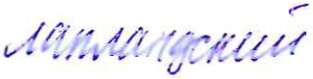лапландский
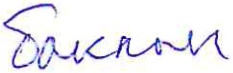баклан
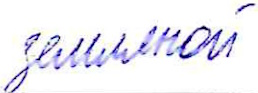земляной
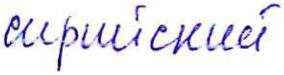сирийский
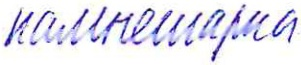камнешарка
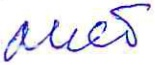аист
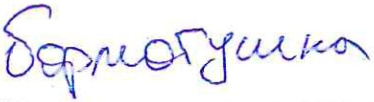бормотушка
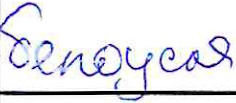белоусая
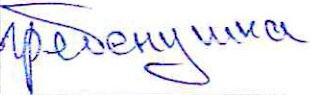гребенушка
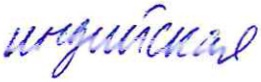индийская
